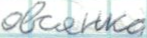овсянка
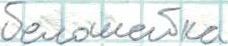белошейка
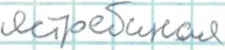ястребиная
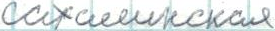сахалинская
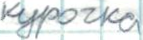курочка
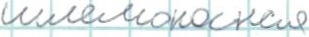шлемоносная
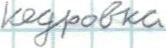кедровка
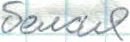белая
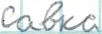савка
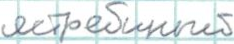ястребиный
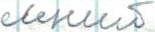синий
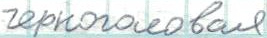черноголовая
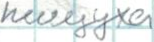пищуха
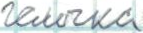гаичка
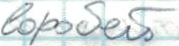воробей
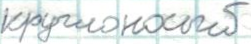круглоносый
